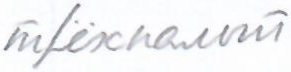трёхпалый
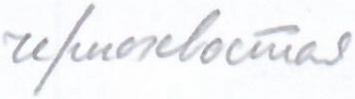чернохвостая
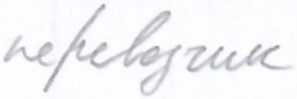перевозчик
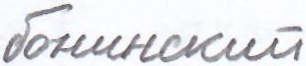бонинский
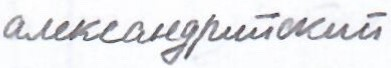александрийский
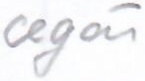седой
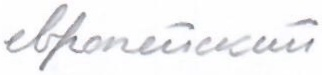европейский
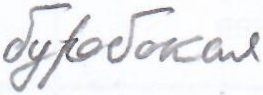буробокая
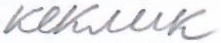кеклик
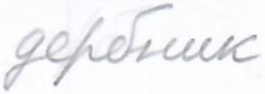дербник
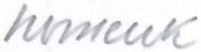пыжик
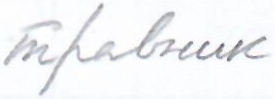травник
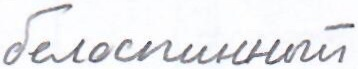белоспинный
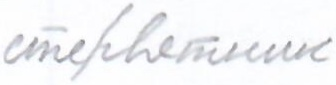стервятник
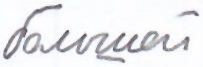большой
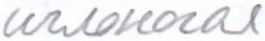иглоногая
